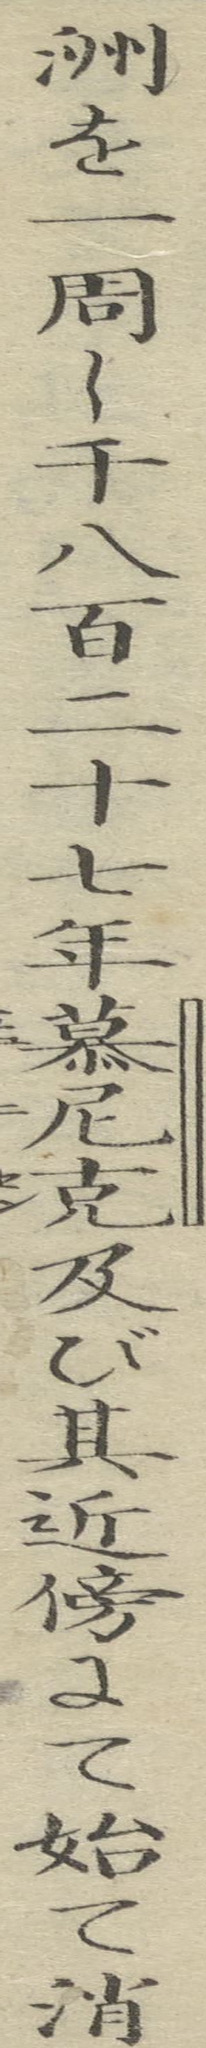洲を一周し千八百二十七年慕尼克及び其近傍にて始て消
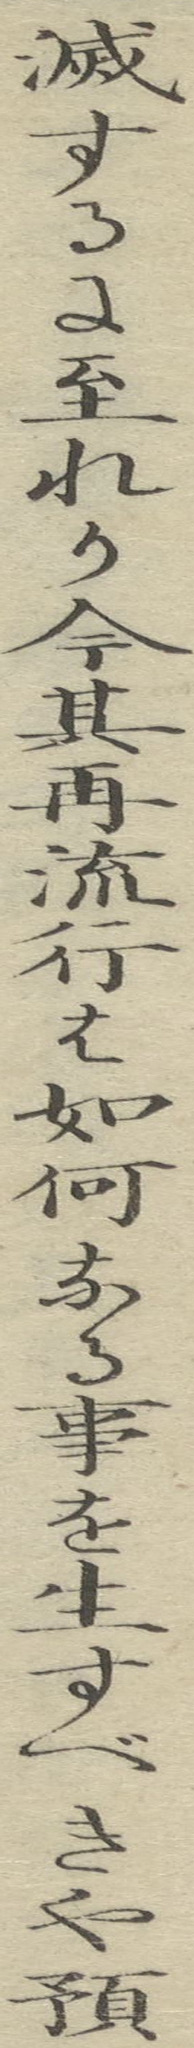滅するに至れり今其再流行は如何なる事を生すべきや預
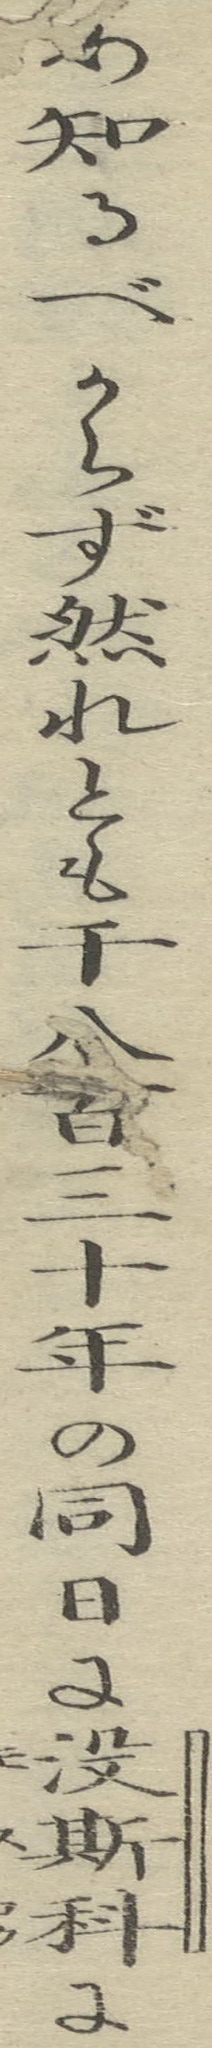め知るべからず然れとも千八百三十年の同日に没斯科に
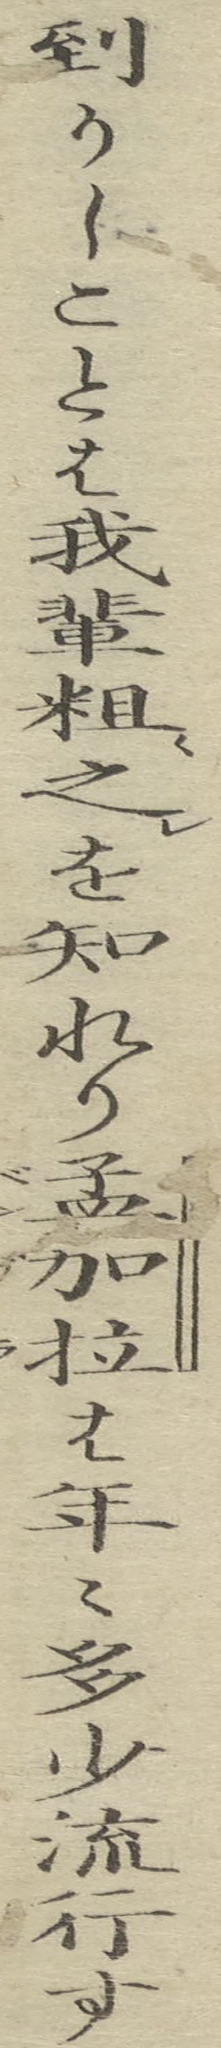到りしことは我輩粗之知れり孟加拉は年々多少流行す
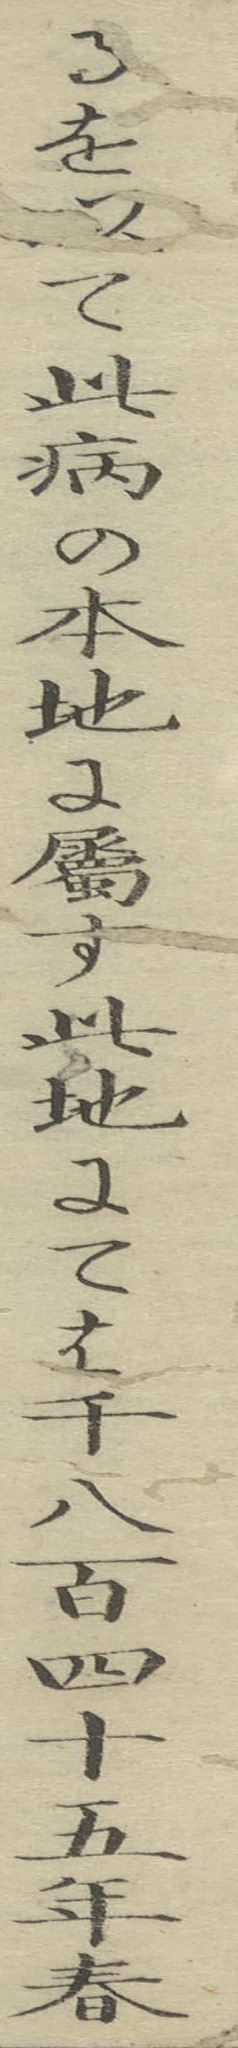るを以て此病の本地に屬す此地にては千八百四十五年春

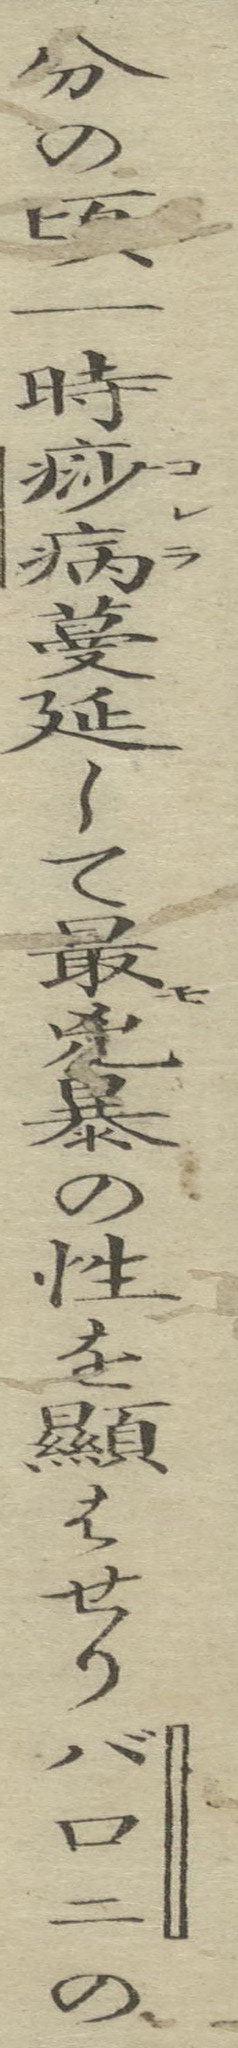分の頃一時痧病蔓延して最凶暴の性を顕はせりバロニの
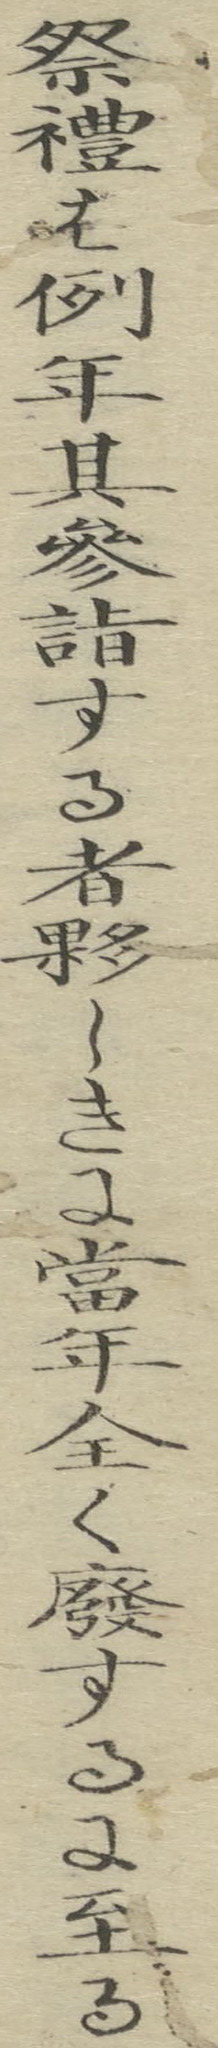祭禮は例年其参詣する者夥しきに當年全く廃するに至る
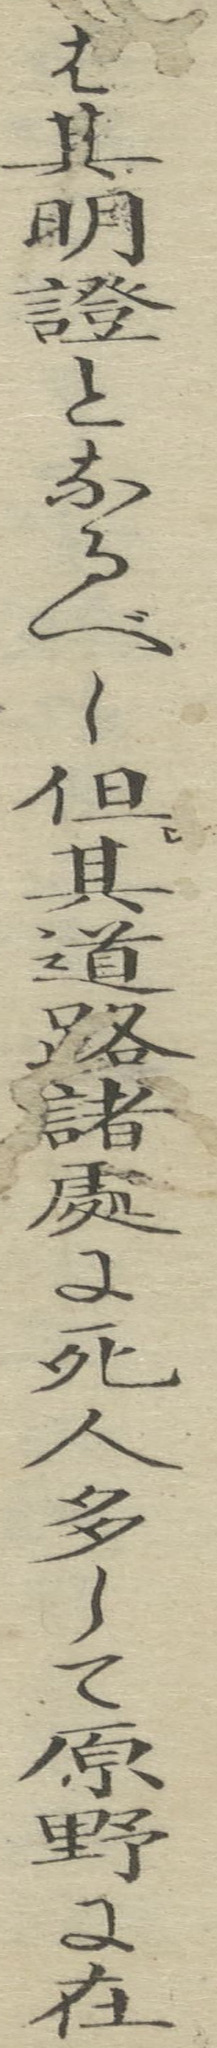は其明證となるべし但其道路諸處に死人多して原野に在
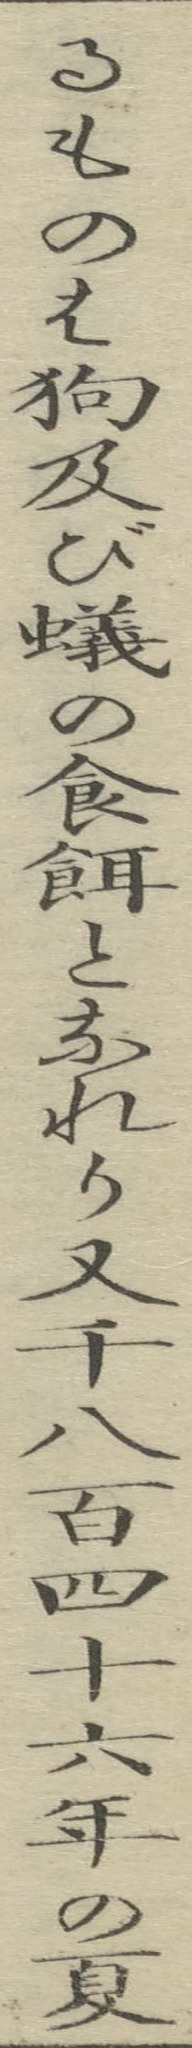るものは狗及び蟻の食餌となれり又千八百四十六年の夏
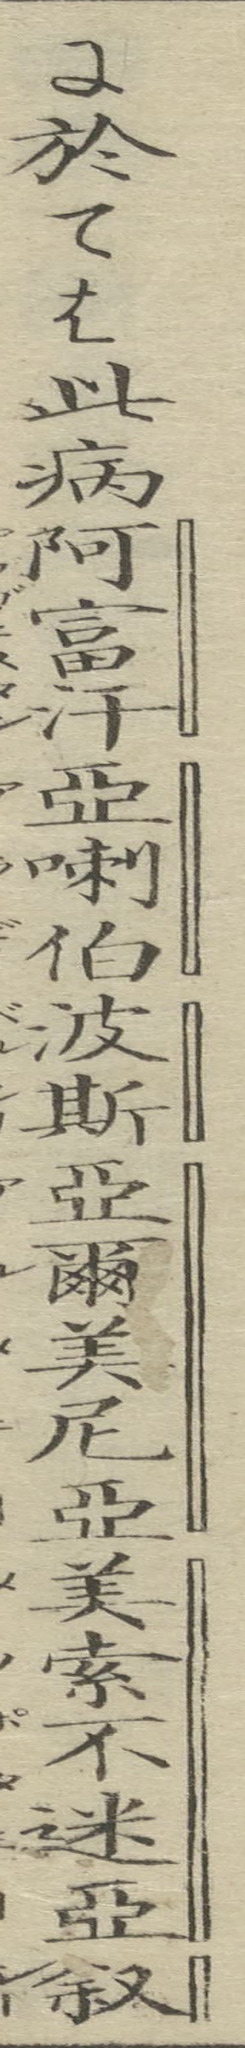に於ては此病阿富汗亞喇伯波斯亞爾美尼亞美索不迷亞叙
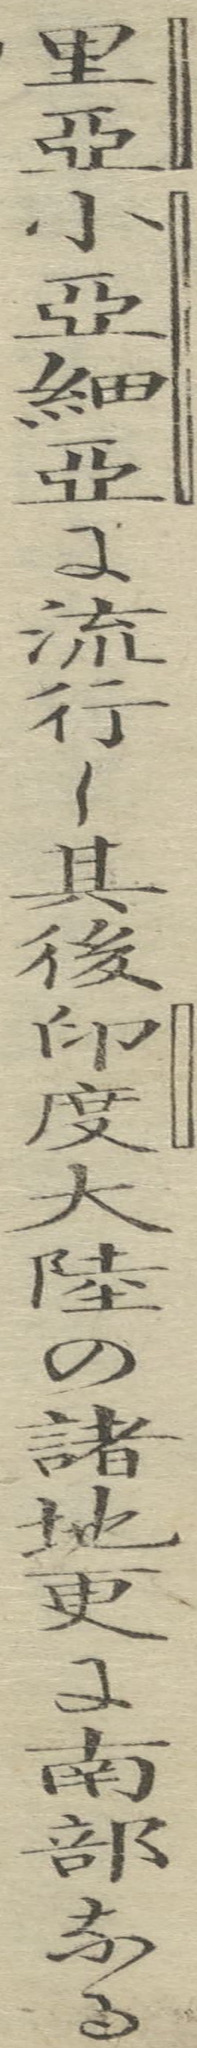里亞小亞細亞に流行し其後印度大陸の諸地更に南部なる
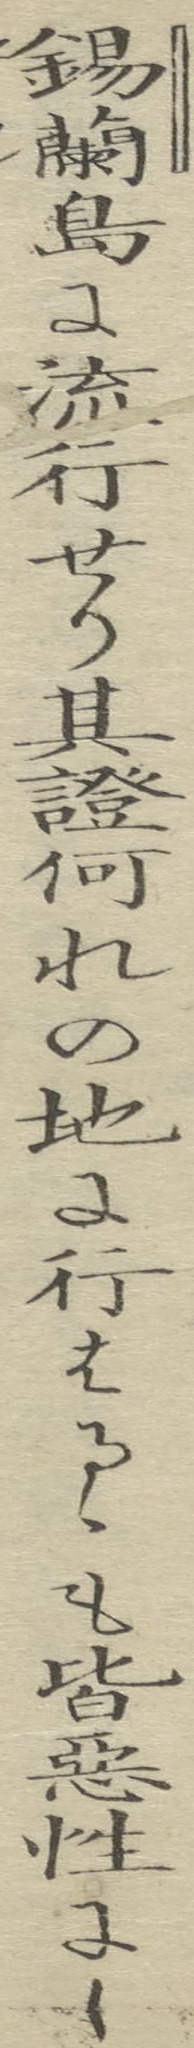錫蘭島に流行せり其證何れの地に行はるゝも皆惡性にし
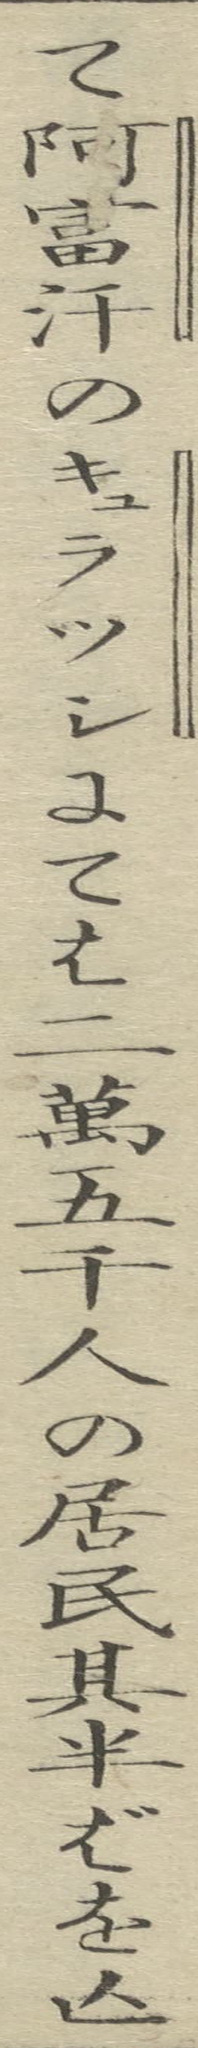て阿富汗のキュラツシにては二萬五千人の居民其半ばを𠤭
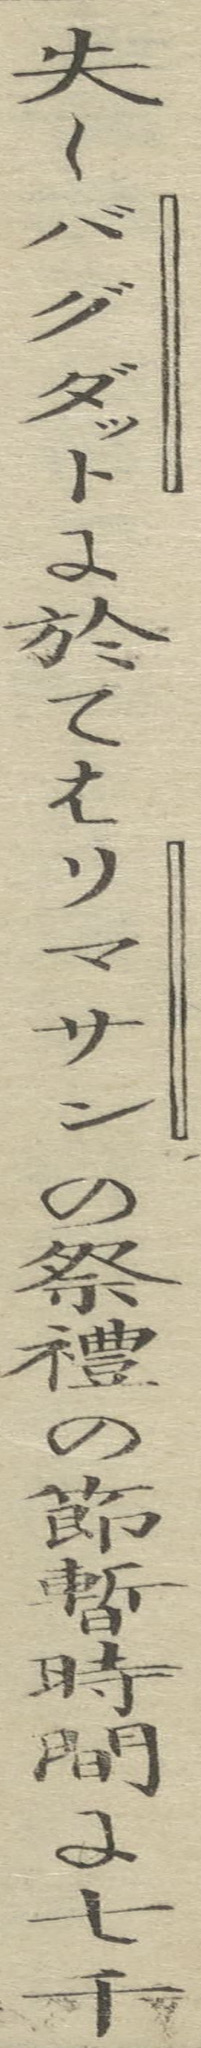失しバクダットに於てはリマサンの祭禮の節暫時間に七千
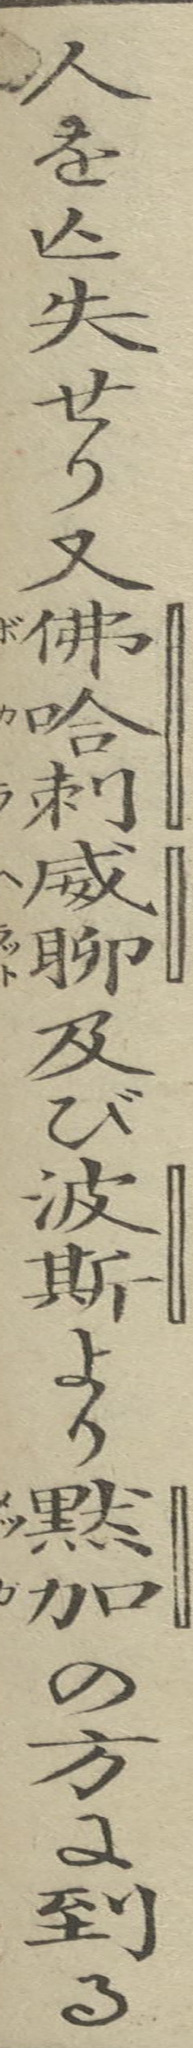人を𠤭失せり又佛哈刺威聊及び波斯より黙加の方に到る
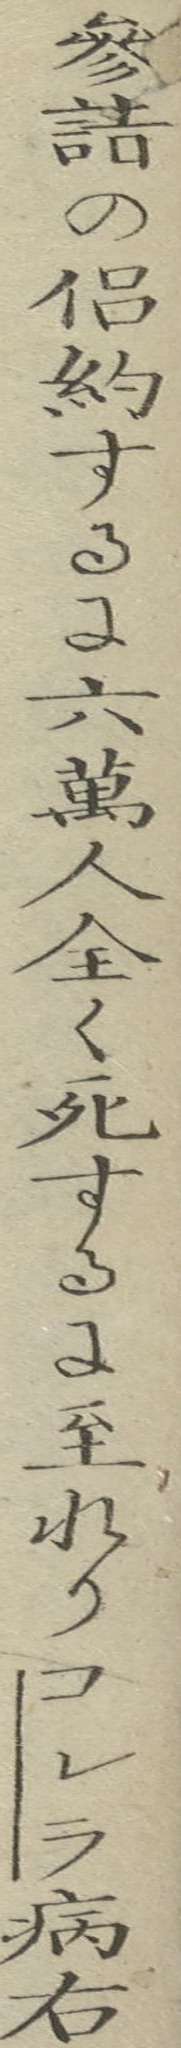参詣の侶約するに六萬人全く死するに至れりコレラ病右
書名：官版疫毒預防説　全
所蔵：東京大学総合図書館 General Library in the University of Tokyo, JAPAN
